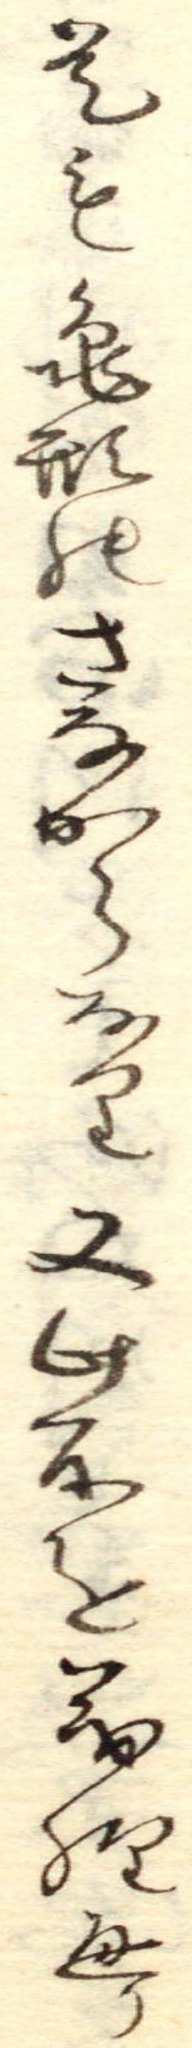是も亀形のさなからなり又此所を義経通り
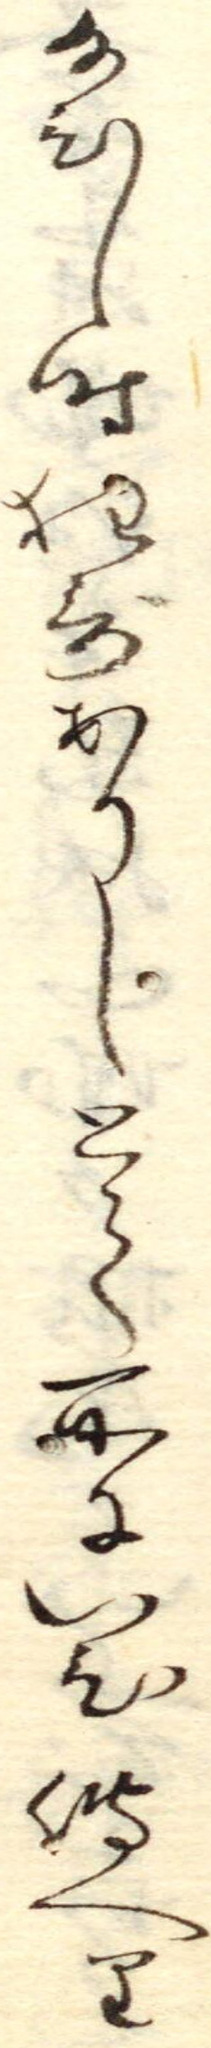給ひし時狂哥ありしとて所にいひ伝へり
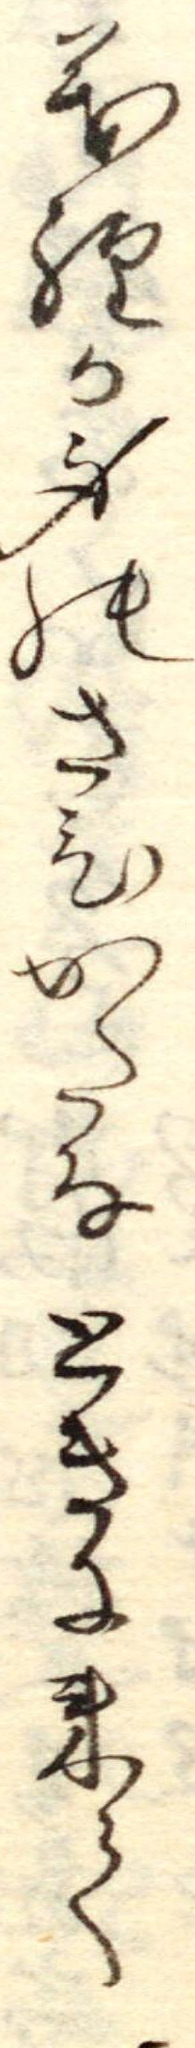義経か身のさひかたなときに来て
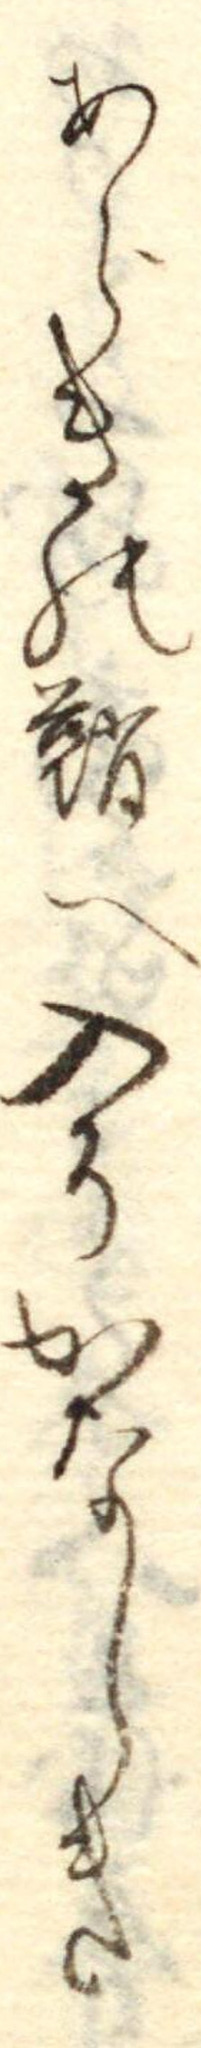あらきの鞘へ入にかなしき
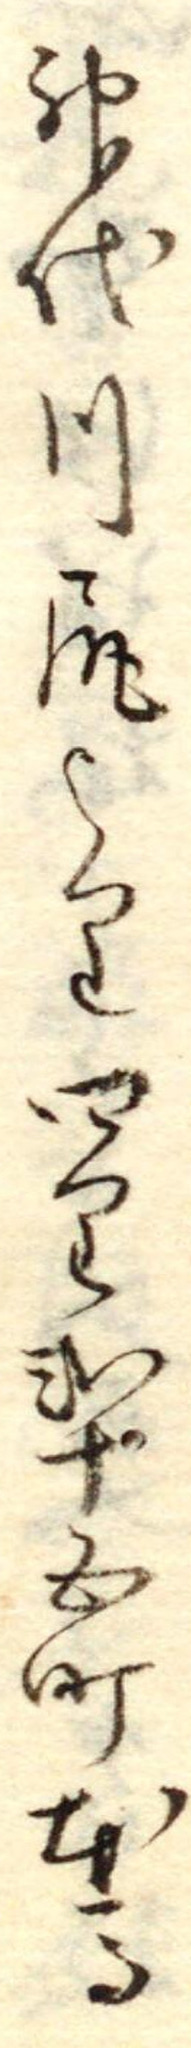神代川尻より四里弐十五町本馬
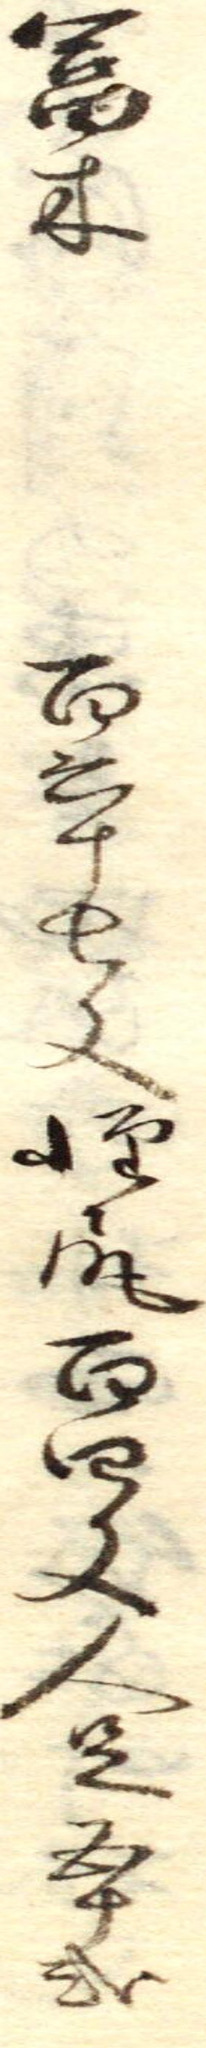冨木百六十七文軽尻百四文人足五十弐
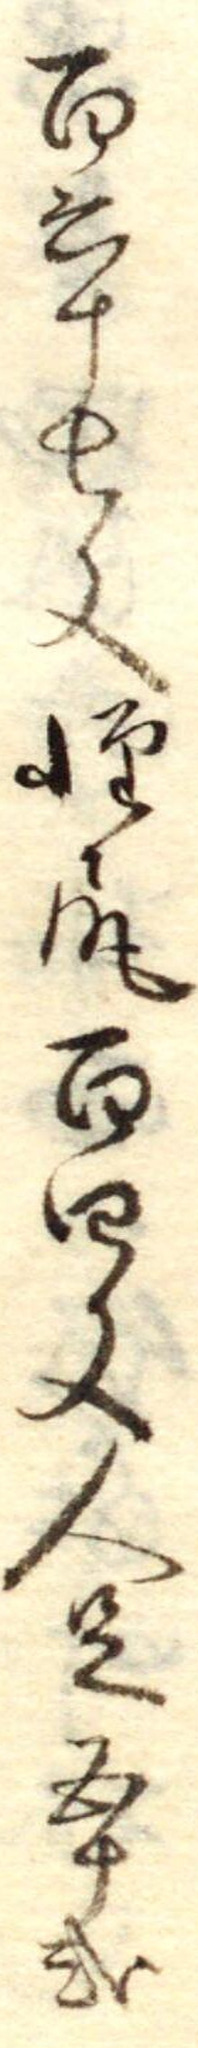冨木百六十七文軽尻百四文人足五十弐
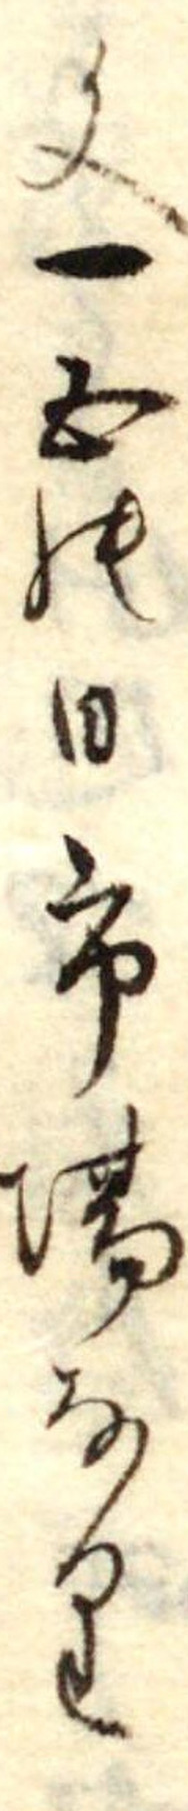文一五の日市場なり

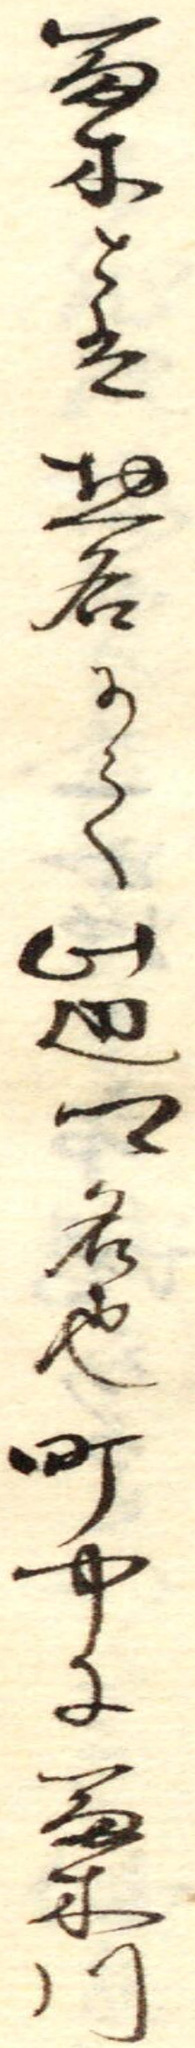冨木とは惣名にて此辺郷名也町中に冨木川
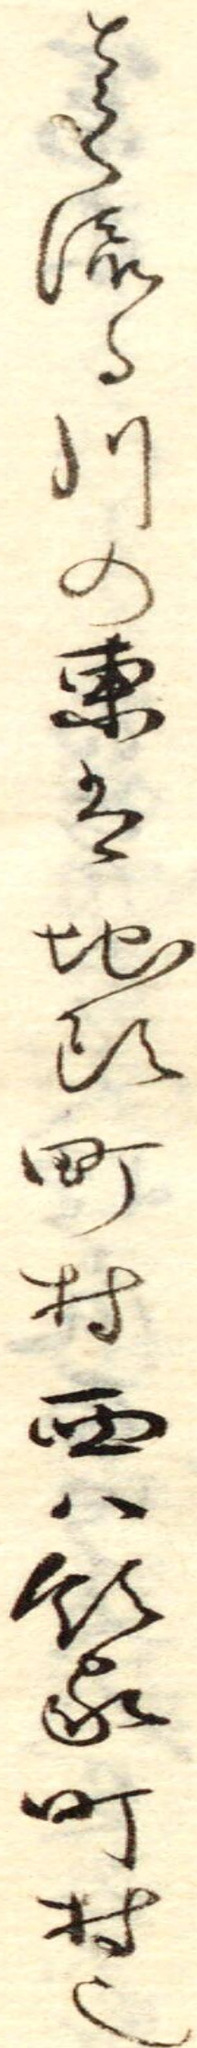とて流る川の東は地頭町村西は領家町村也
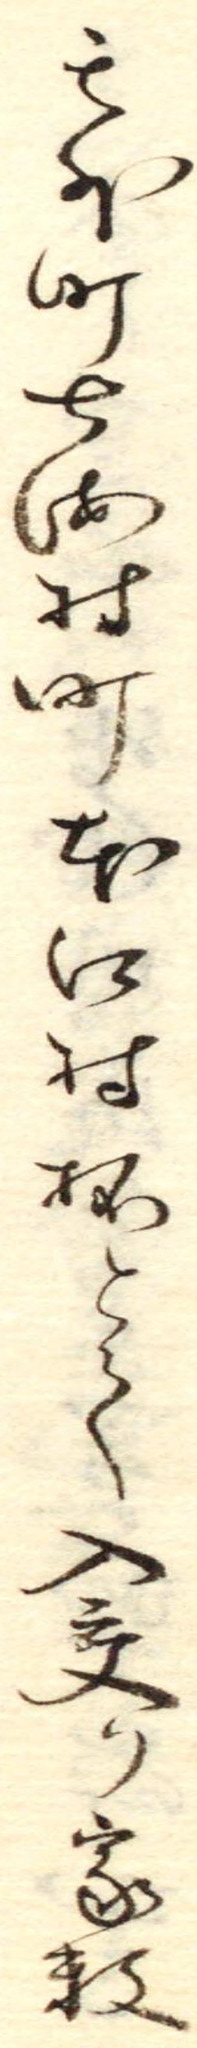其外町七海村町本口村入交り家数
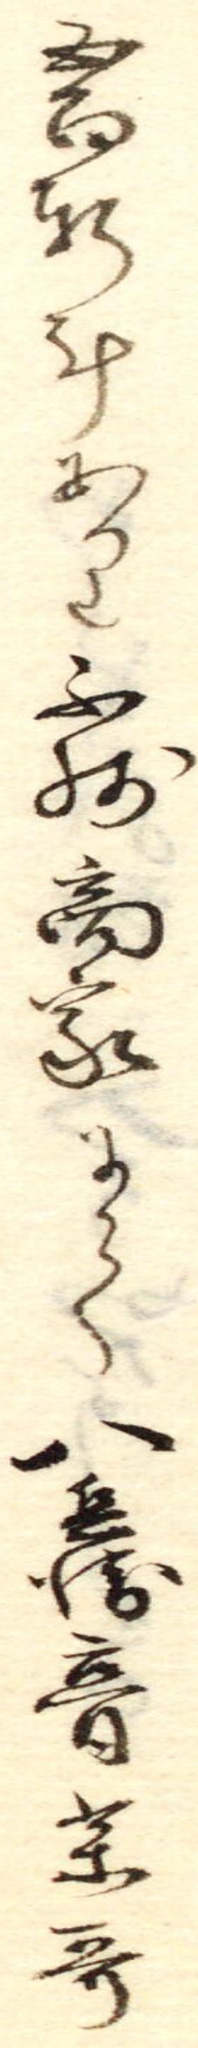五百軒計あり不残商家にて八兵衛膏薬哥
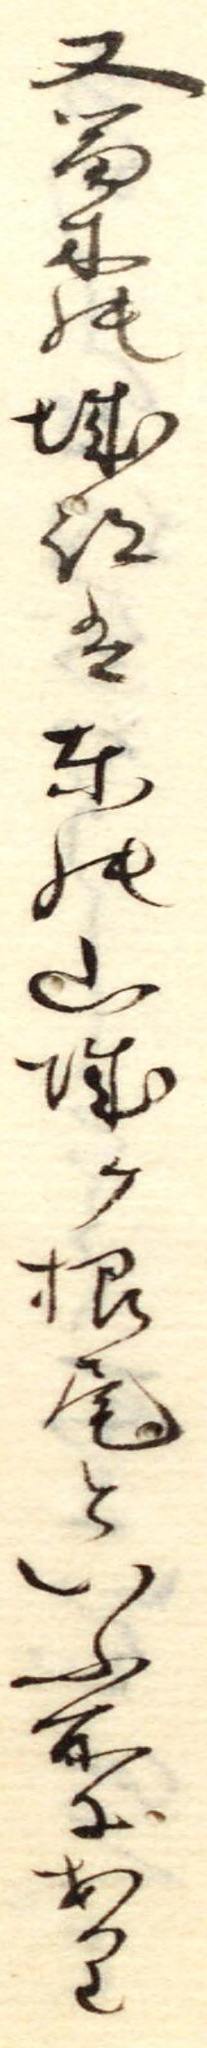又冨木の城跡は東の山城ヶ根尾といふ所にあり
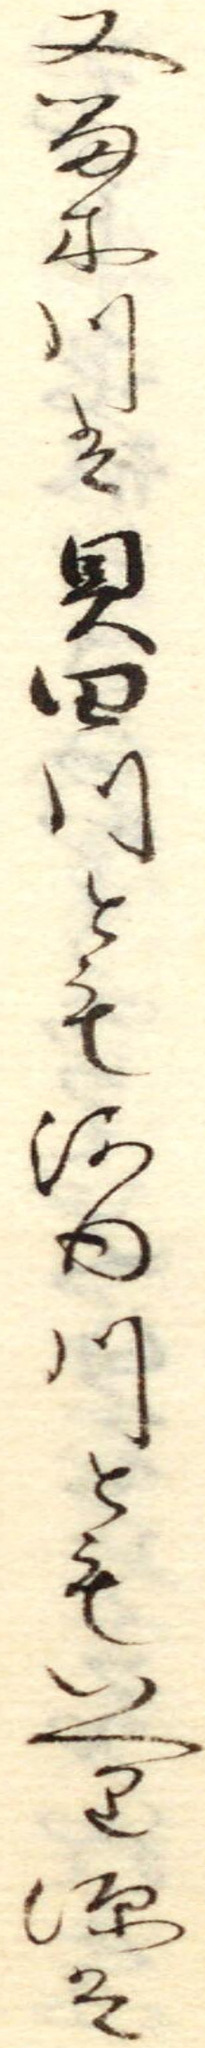又留木川は貝田川とも河内川ともいへり源は
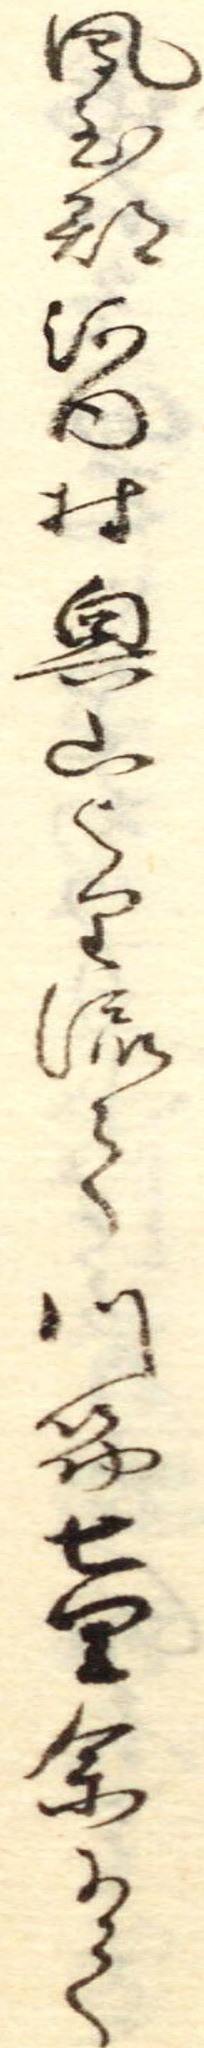鳳至郡河内村奥山より流て川筋七里余にて
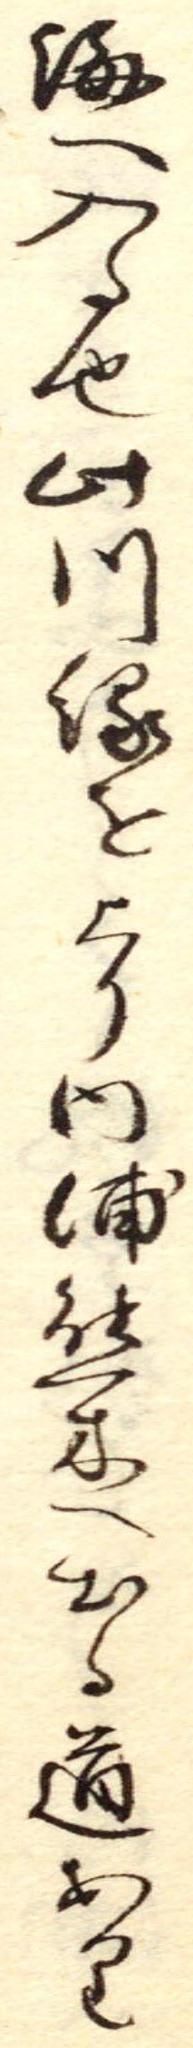海へ入る也此川縁を上り内浦熊木へ出る道あり
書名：能登名跡誌
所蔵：Ishikawa Prefectural Library
